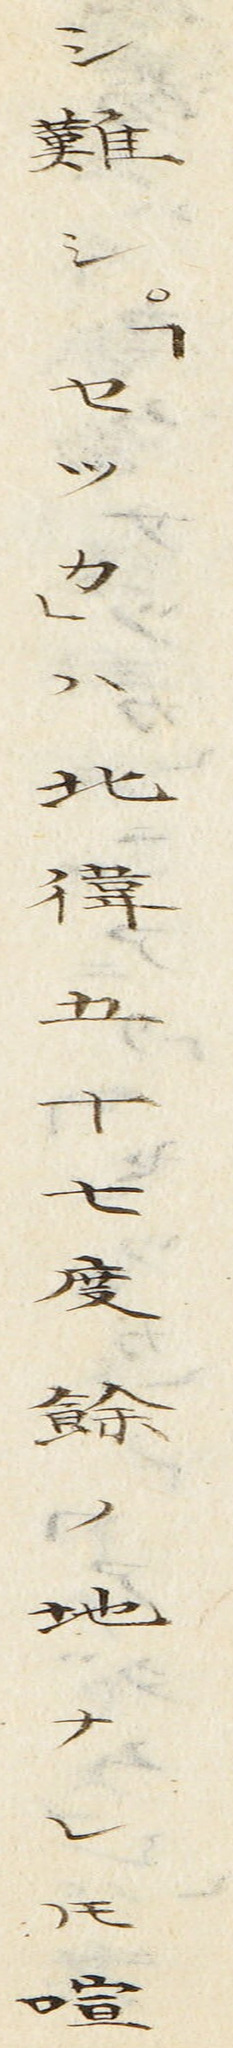シ難シ。「セツカ」は北緯五十七度余ノ地ナレドモ喧
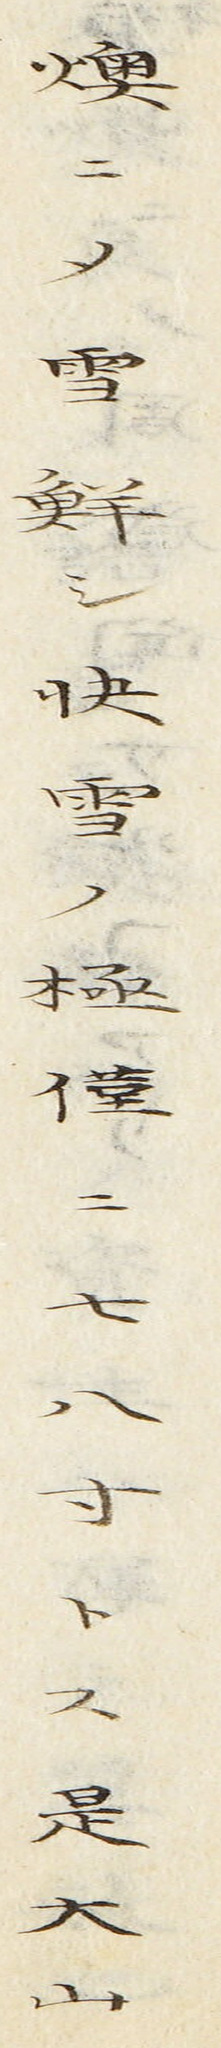燠ニシテ雪鮮シ快雪ノ極僅ニ七八寸トス是大山
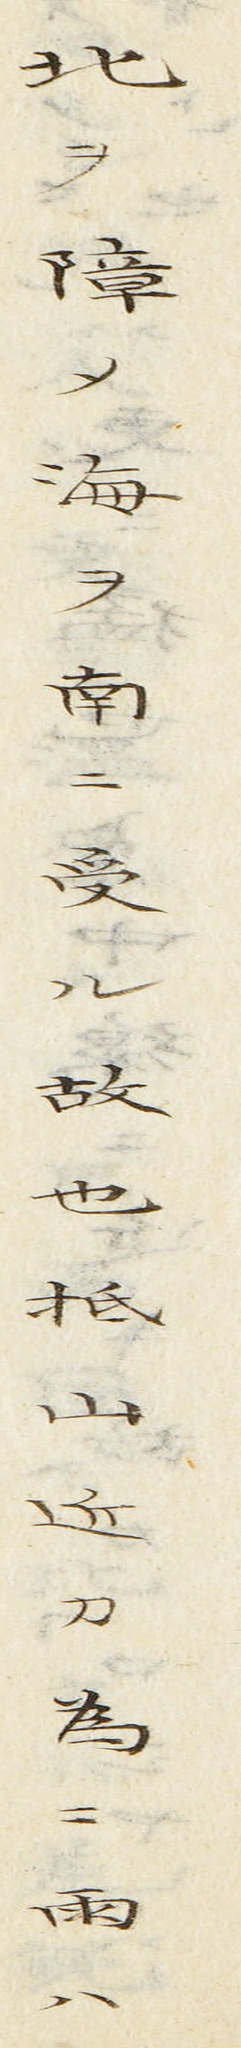北ヲ障シテ海ヲ南ニ受ル故也ｔ抵山近カ為ニ雨ハ
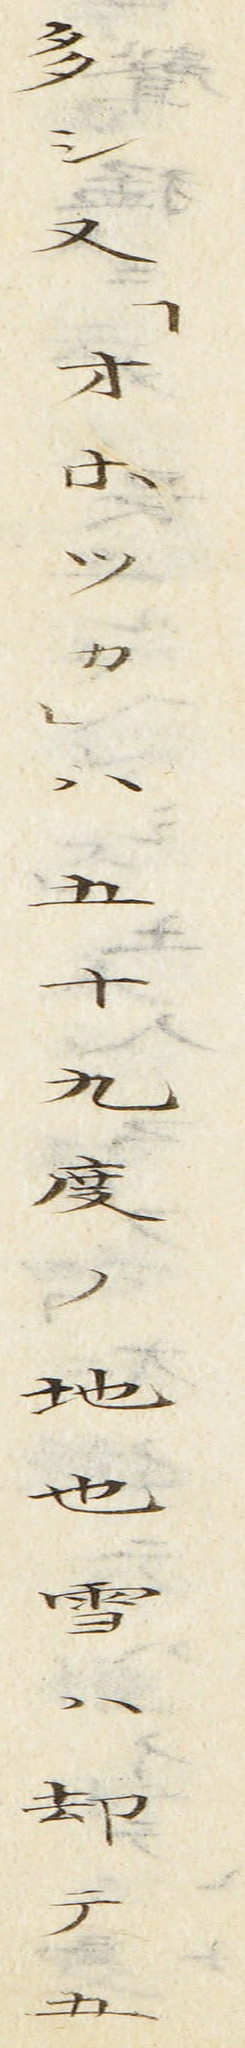多シ又「オホツカ」ハ五十九度ニ地也雪ハ却テ五
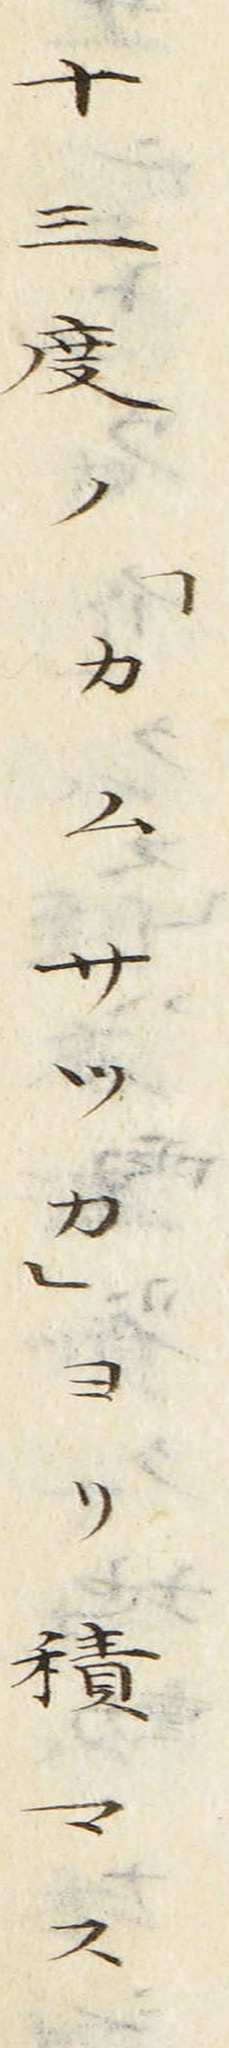十三度ノ「カムサツカ」ヨリ積マス

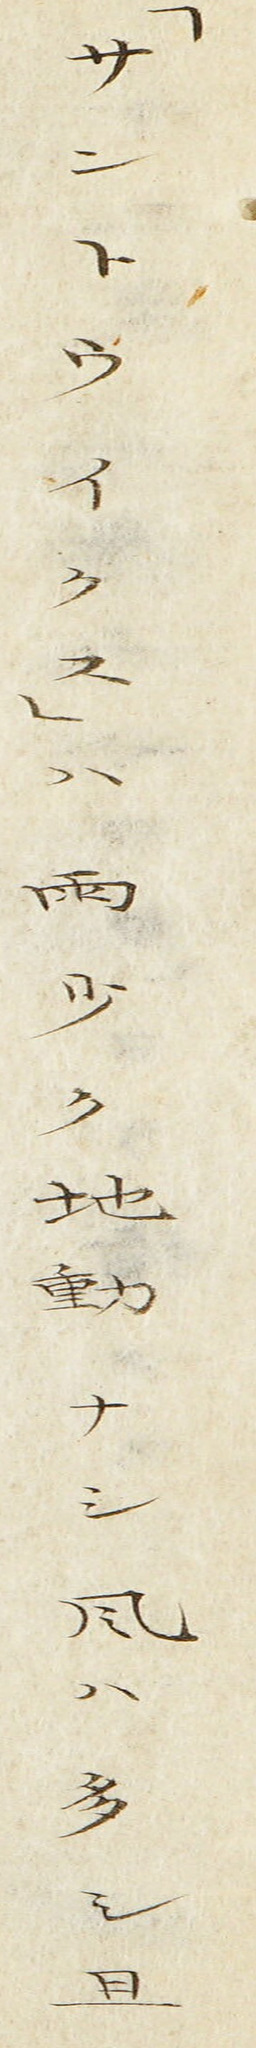〇「サントウイクス」ハ雨少ク地動ナシ風ハ多シ旦
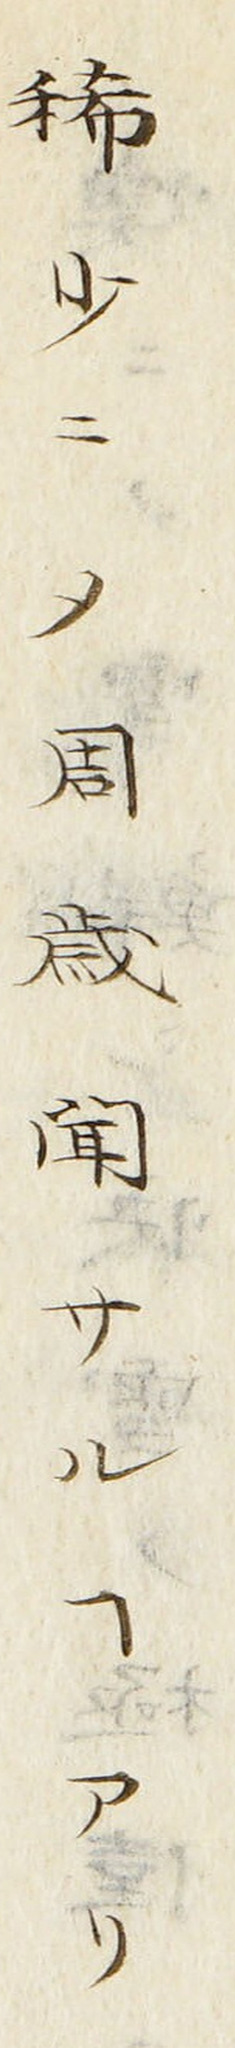稀少ニシテ周歳聞サルコトアリ
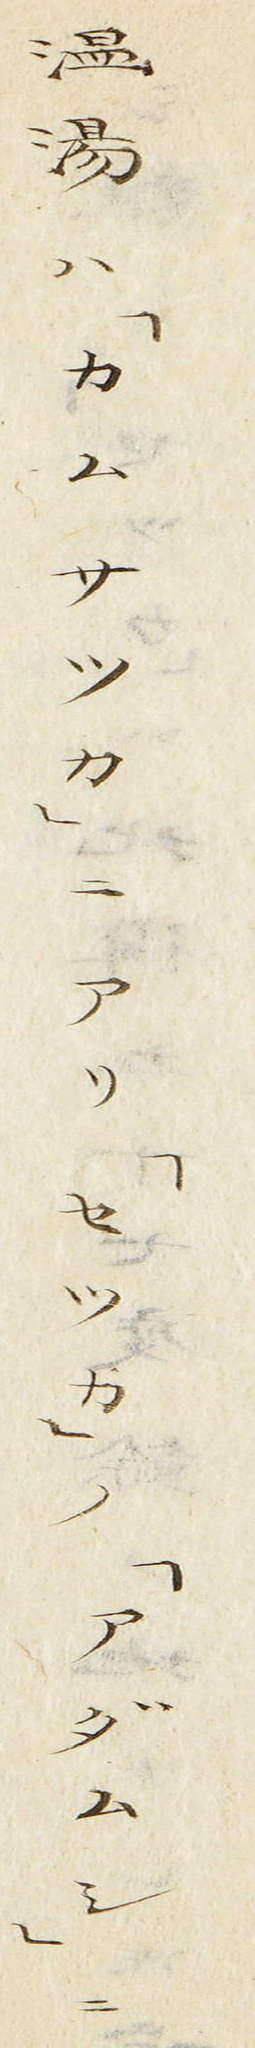〇温湯ハ「カムサツカ」ニアリ「セツカ」ノ「アダムシ」ニ
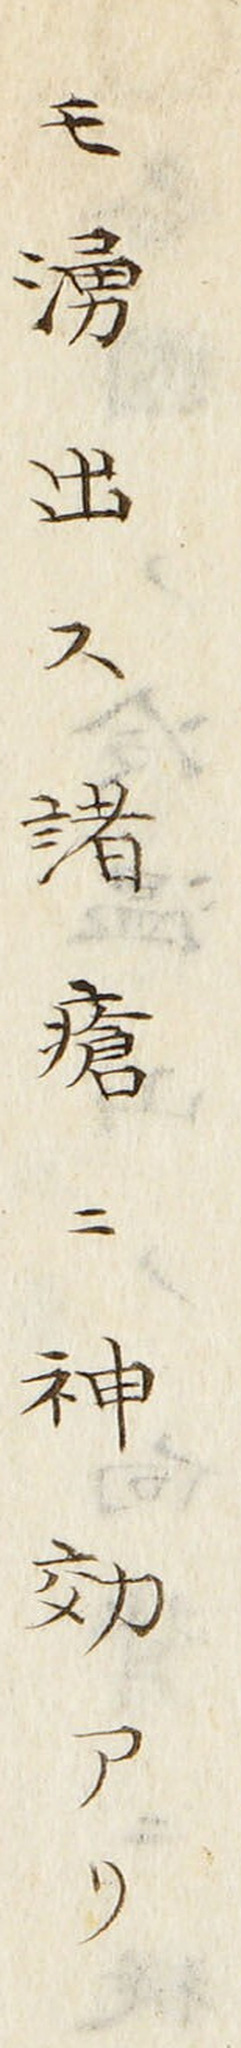モ湧出ス諸瘡ニ神効アリ
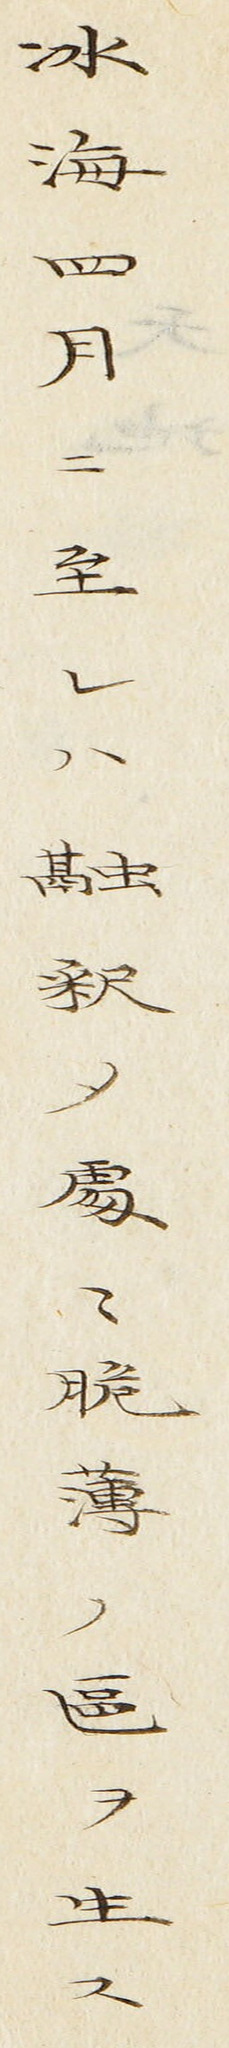〇氷海四月ニ至レハ融釈シテ所々脆薄ノ区ヲ生ス
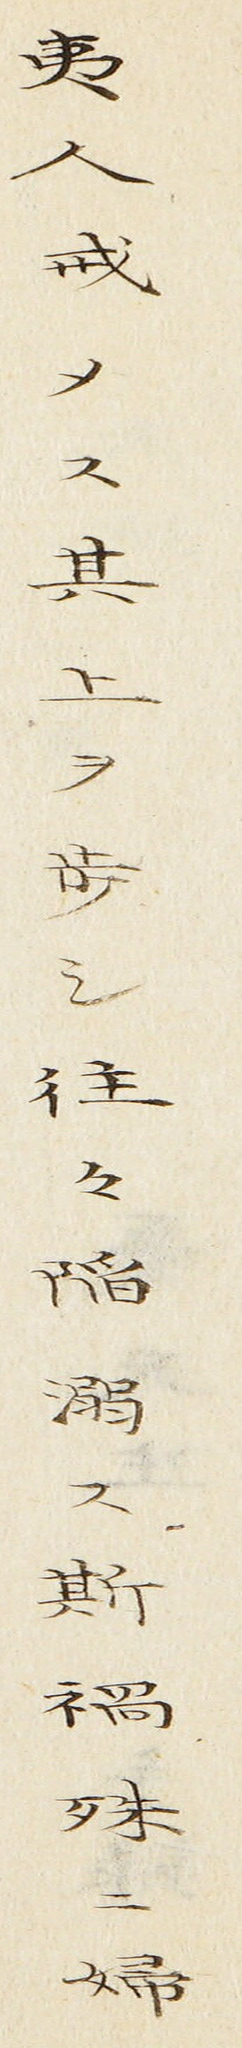夷人警戒メス其上ヲ歩シ往々陥溺ス斯禍殊ニ婦
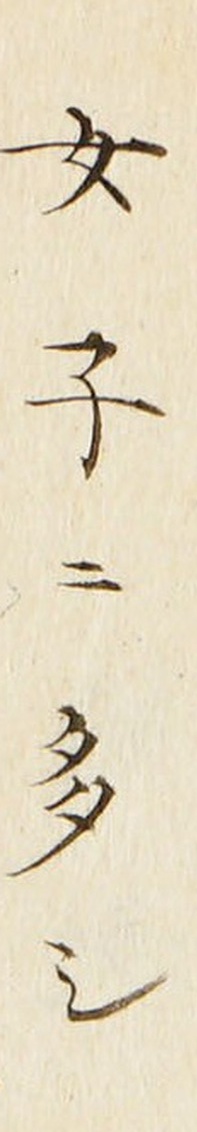女子ニ多シ
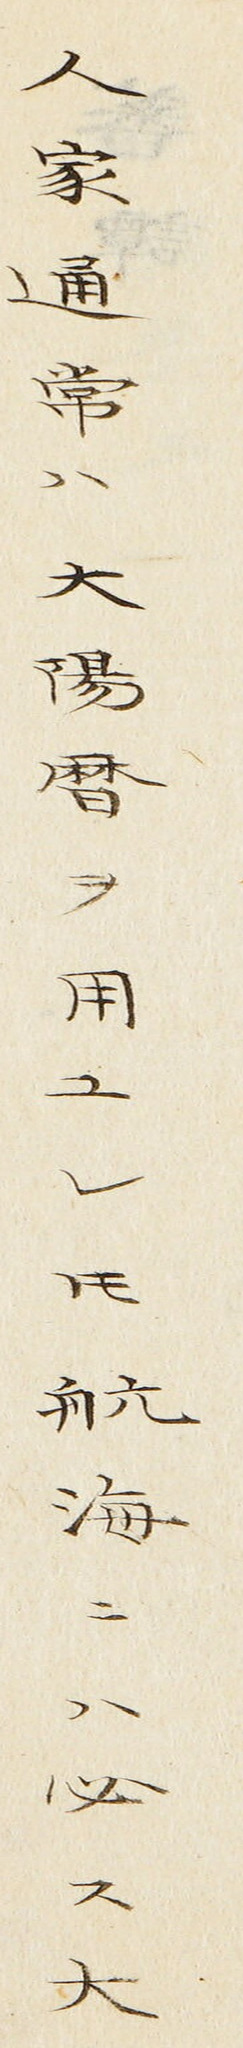〇人家通常ハ大陽暦ヲ用ユレドモ航海ニハ必ス大
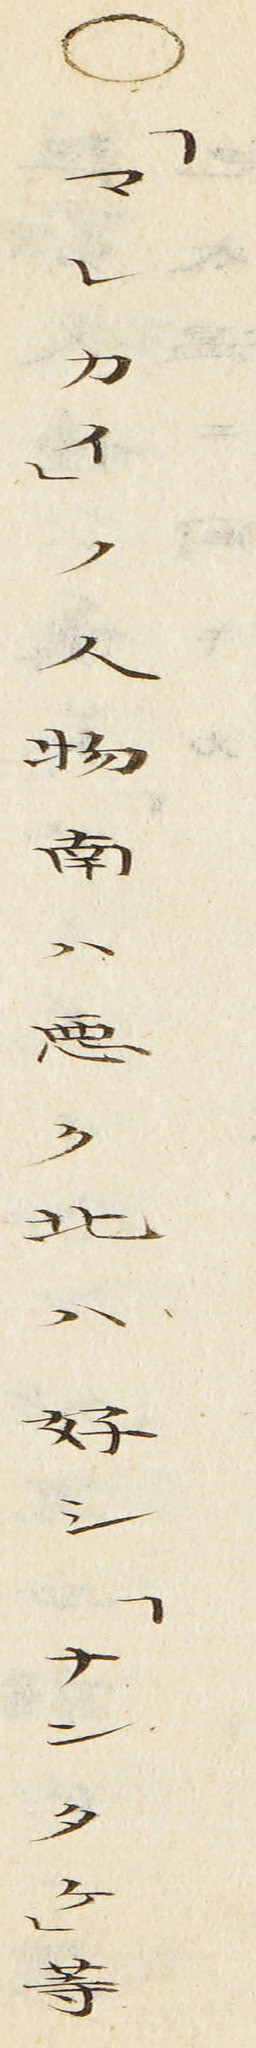〇「マイカレ」ノ人物南ハ悪ク北ハ好シ「ナンタケ」等
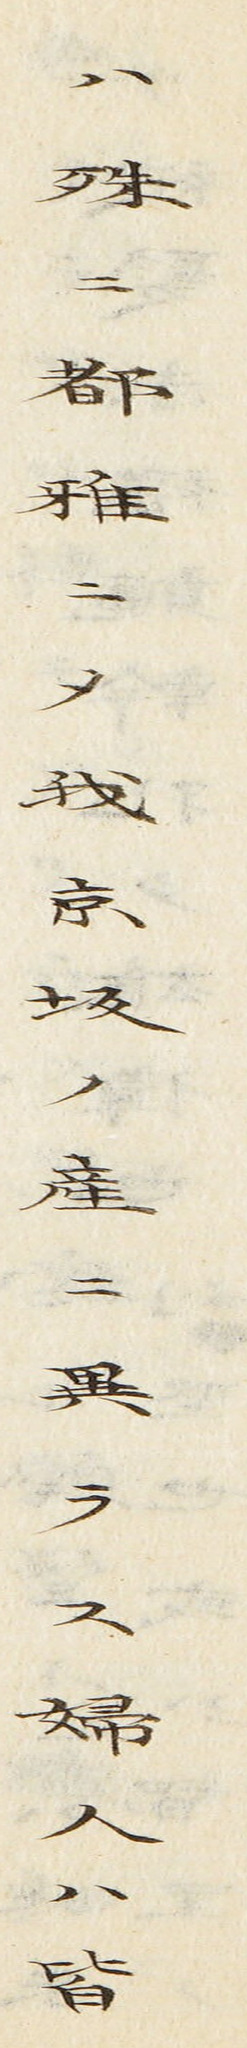ハ殊ニ都雅ニシテ我京坂ノ産ニ異ラス婦人ハ皆
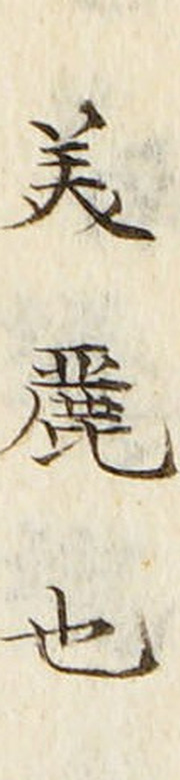美麗也
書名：蕃談
